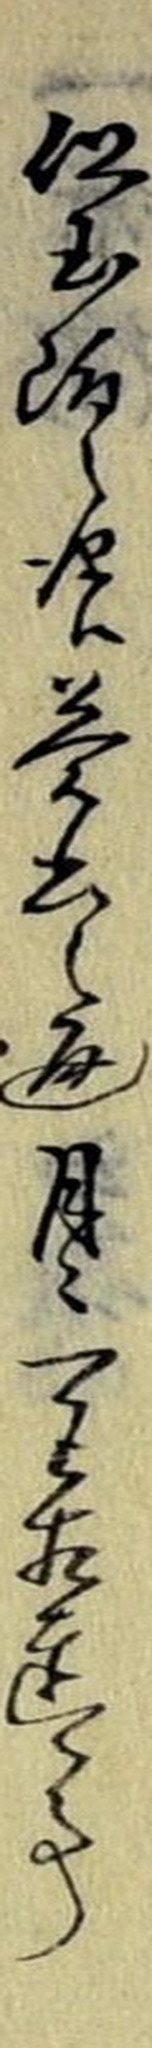但出附之儀は答書之通月々可被相達候事
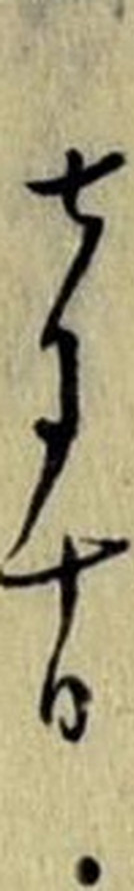七月十日
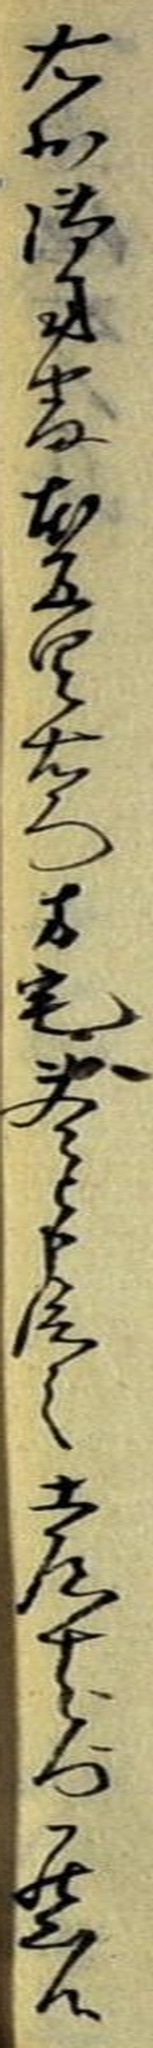右於御用番本多四郎左衛門宅夫々被申渡之土屋十郎右衛門罷出候
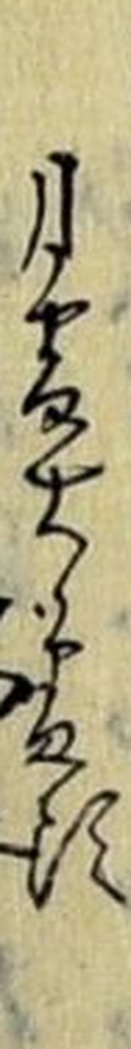月番大御番頭
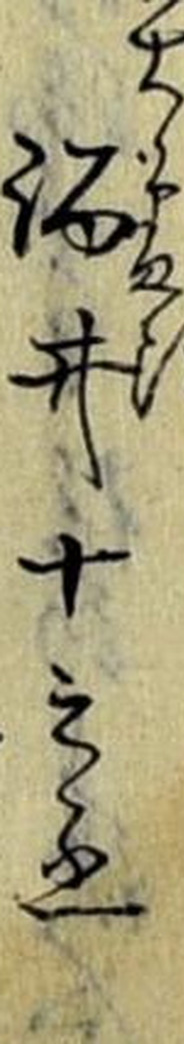酒井十之丞
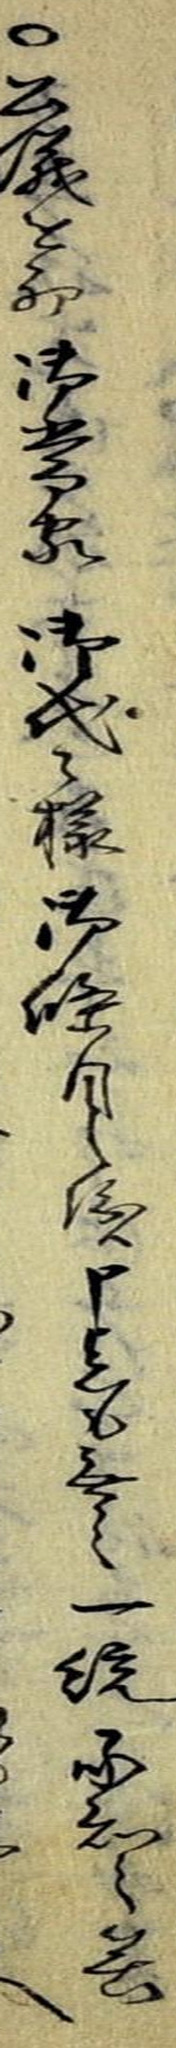○公儀を初御当家御代々様御條目之儀は申迄も無之一統承知之筈
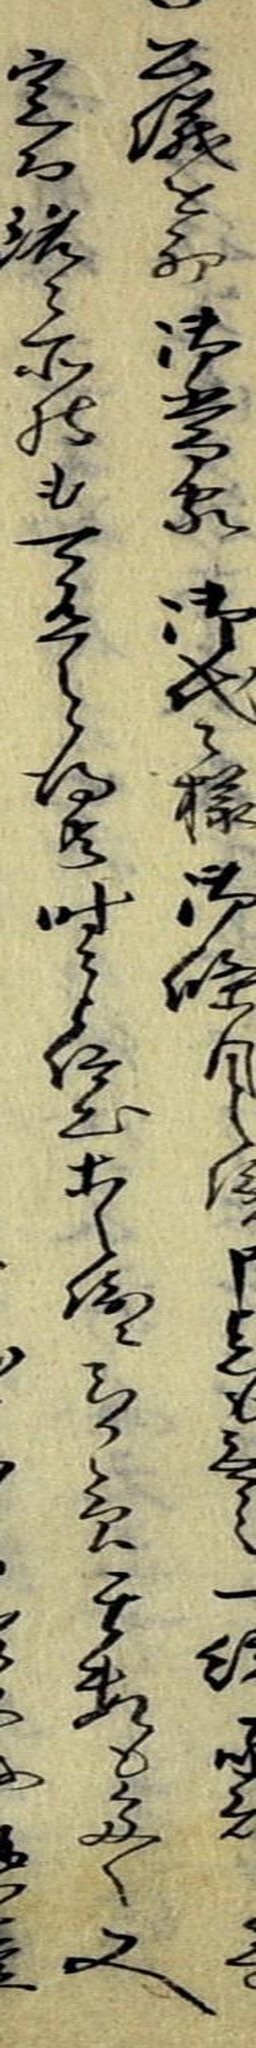定而銘々所持も可有之候得共時々被仰出等之儀に至り候而は其数も多く又
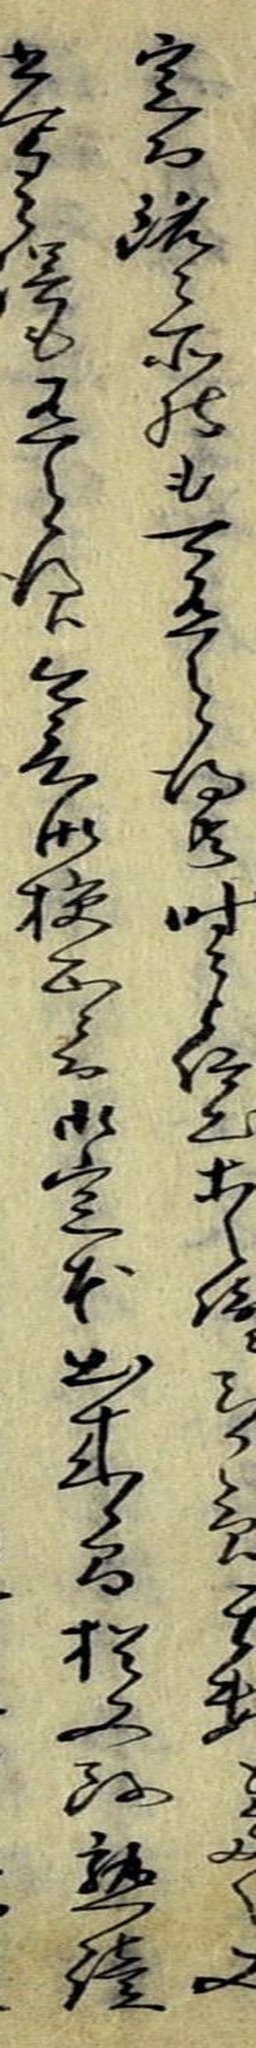書写之儘も有之候得は今度御校正に而御定本出来候間猶又致熟読
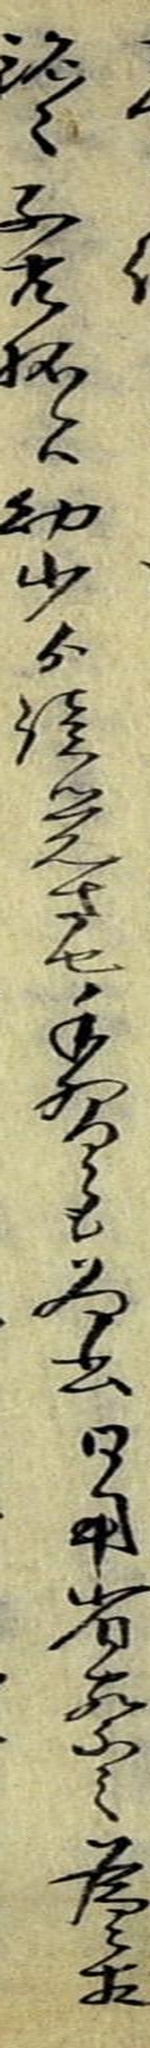銘々子共抔へは幼少ゟ読覚させ手習にも為書日用省察之為に相
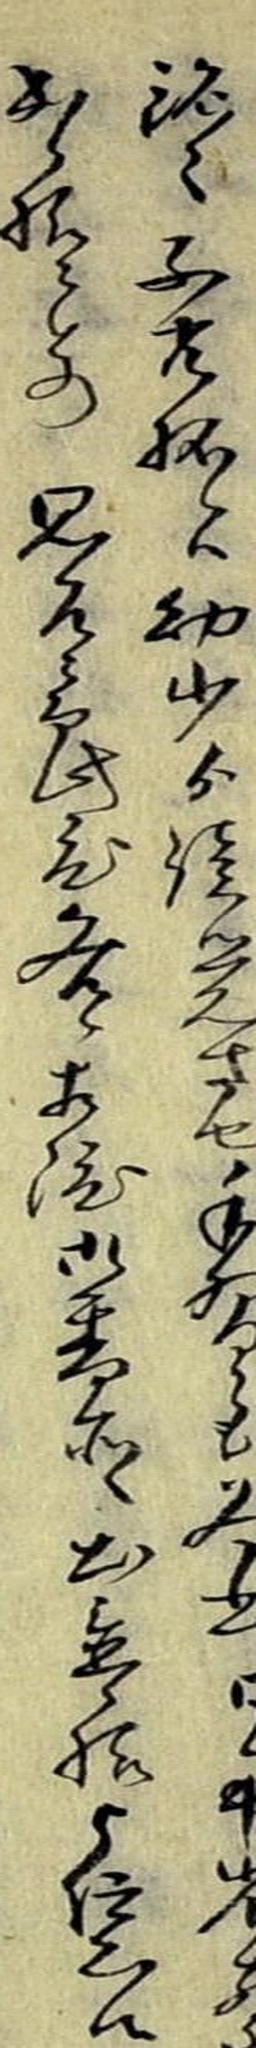成候様にとの思召に而此度各へ相渡御番所へ出置候様被仰出候
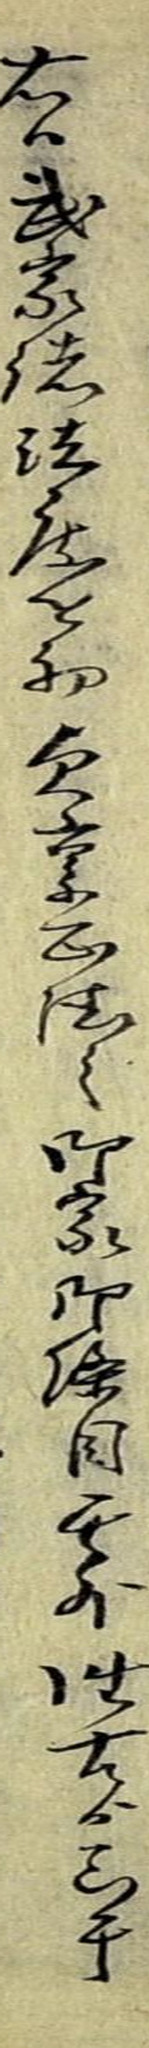右衛門は武家諸法度を初貞享正徳之御家御條目其外往古ゟ至于
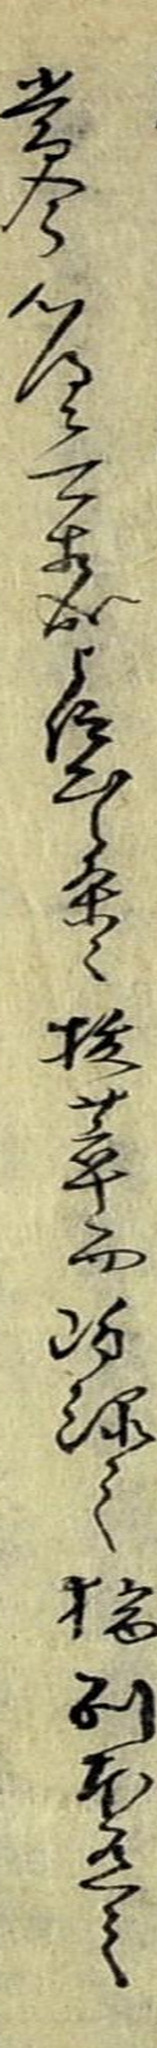当今心得に可相成被出候条々抜粋に而附録之格別本有之
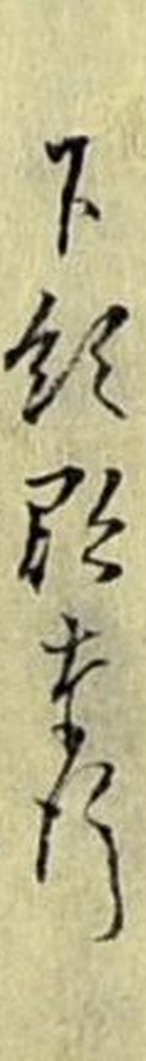下領郡奉行
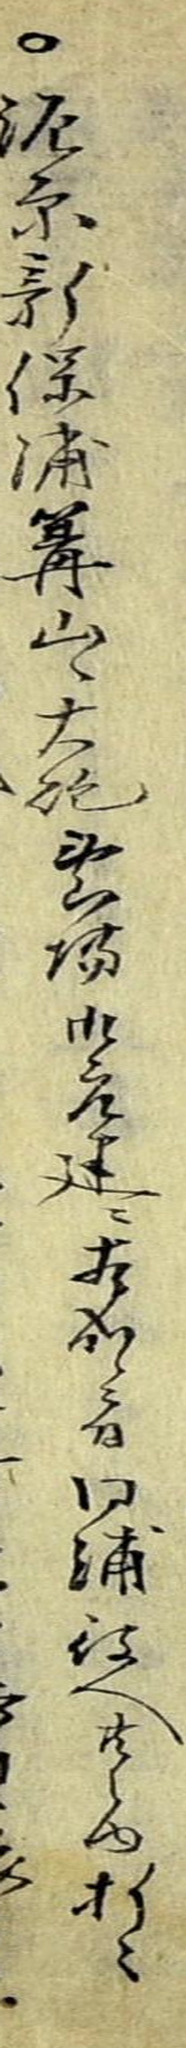○泥原新保浦篝山へ大炮台場御取建に相成候に付同浦役人共之内折々
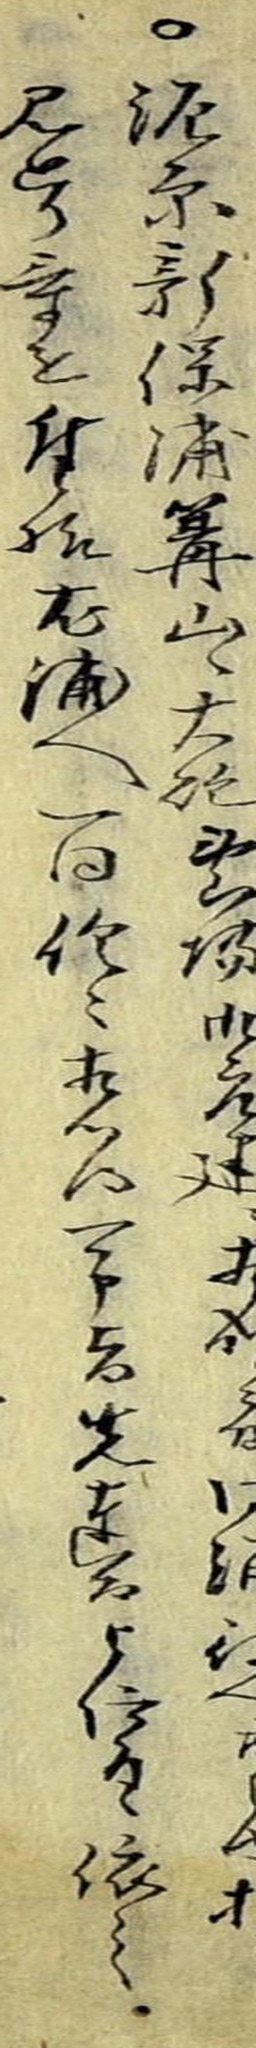見廻り気を付候様尤浦人一同倶々相心得可申旨先達而被仰付候依之
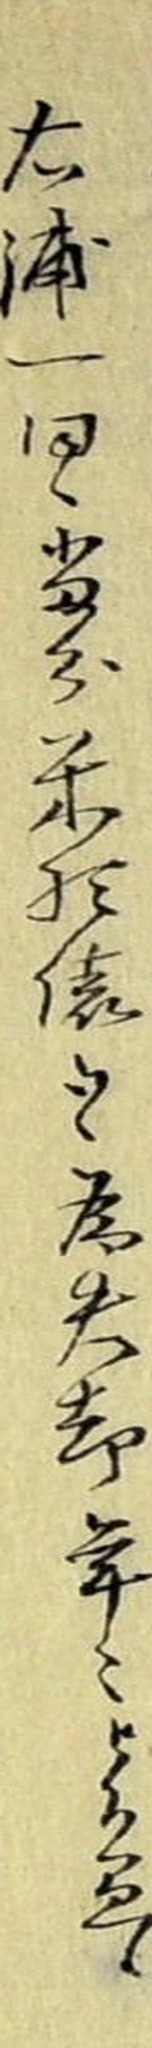右浦一同へ当分米拾俵つヽ為失却年々被下置候
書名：命令之部 六
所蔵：福井県文書館 Fukui Prefectural Archives
